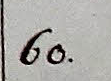60.
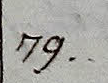79.
